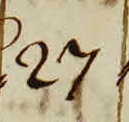27
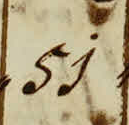51
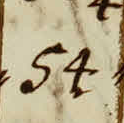54
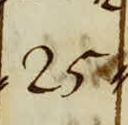25
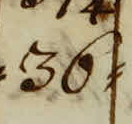36
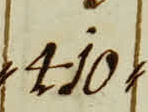410
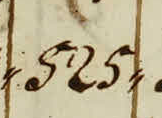525
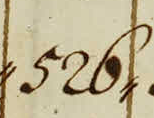526
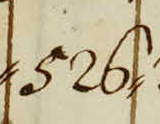526
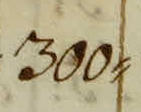300
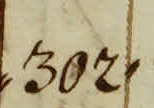302
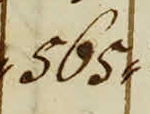565
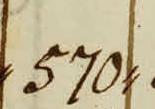570
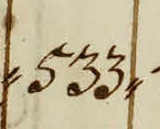533
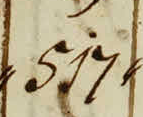517
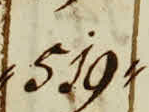519
